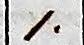1.
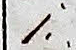1.
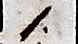1.
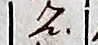2.
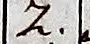2.
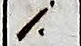1.
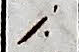1.
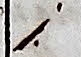1.
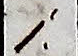1.
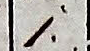1.
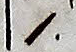1.
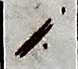1.
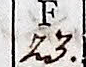23.
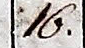16.
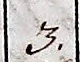3.
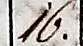16.
